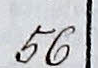56
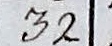32
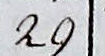29
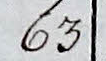63
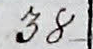38
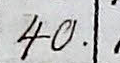40.
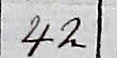42
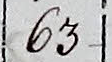63
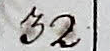32
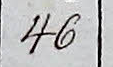46
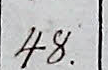48.
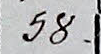58
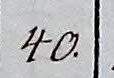40.
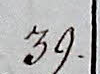39
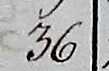36
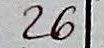26
